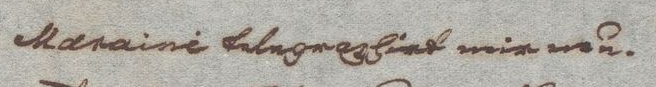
Maraini telegraphirt mir neu-
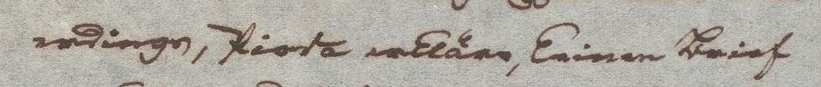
erdings, Pioda erkläre, keinen Brief
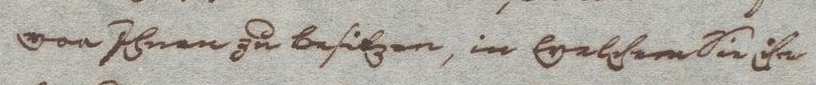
von Ihnen zu besitzen, in welchem Sie ihn
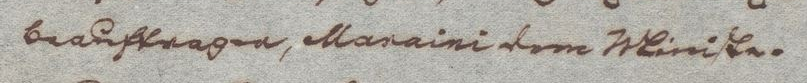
beauftragen, Maraini dem Ministe-
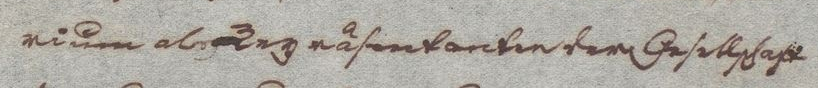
rium als Repräsentanten der Gesellschaft
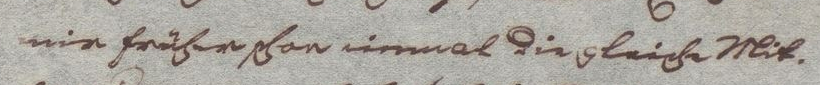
mir früher schon einmal die gleiche Mit-
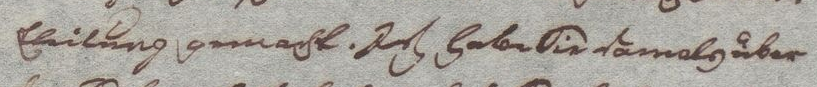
theilung gemacht. Ich habe Sie damals über
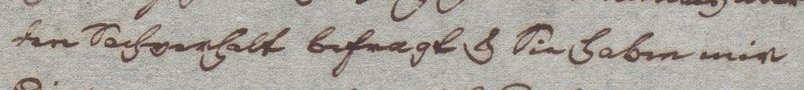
den Sachverhalt befragt & Sie haben mir
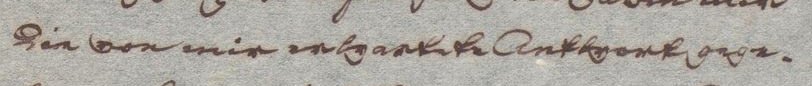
die von mir erwartete Antwort gege-
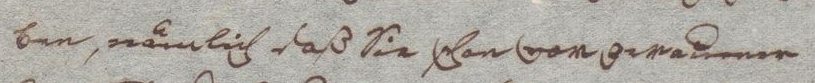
ben, nämlich daß Sie schon vor geraumer
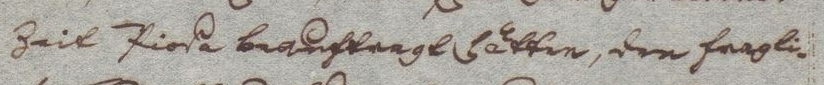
Zeit Pioda beauftragt hätten, den fragli-
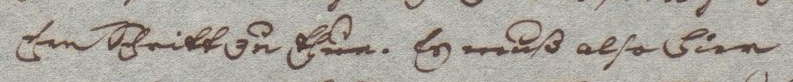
chen Schritt zu thun. Es muß also hier
